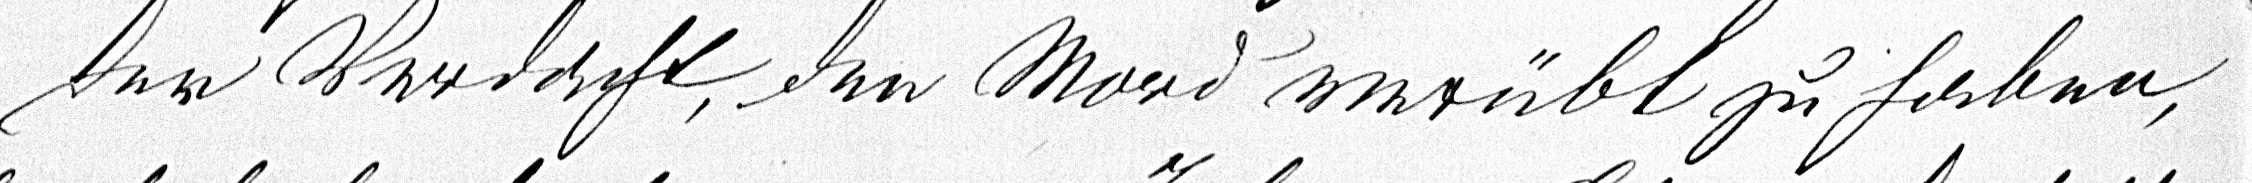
Der Verdacht, den Mord verübt zu haben,
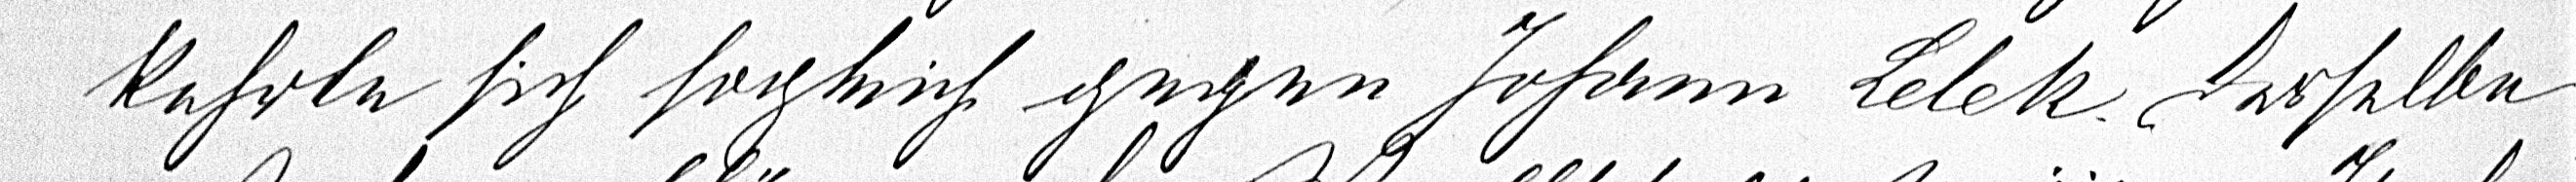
kehrte sich sogleich gegen Johann Lelek. desselbe
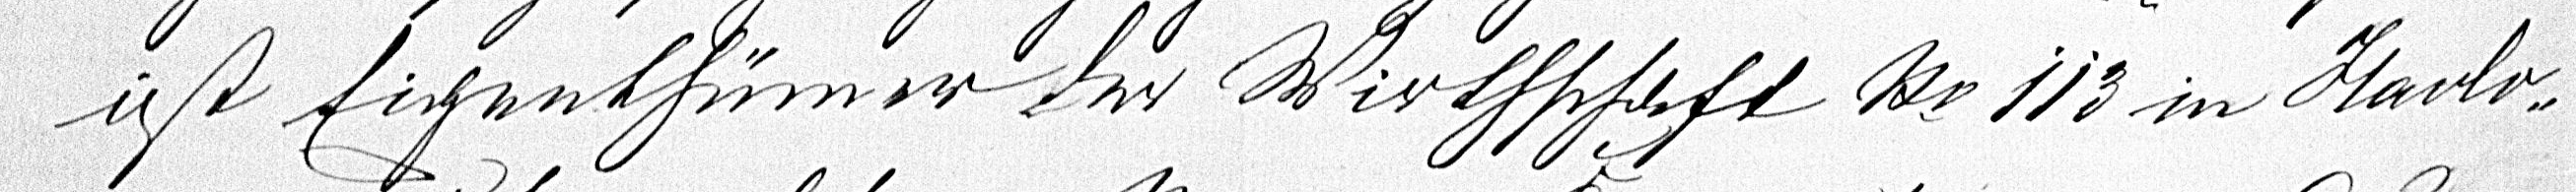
ist Eigenthümer der Wirthschaft Nr. 113 in Havlo¬
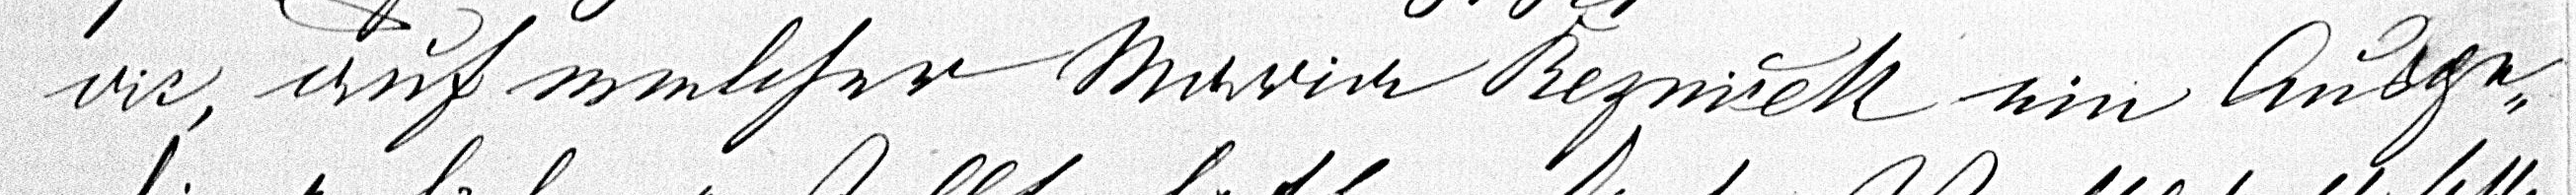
vic, auf welcher Maria Rezniček ein Ausge¬
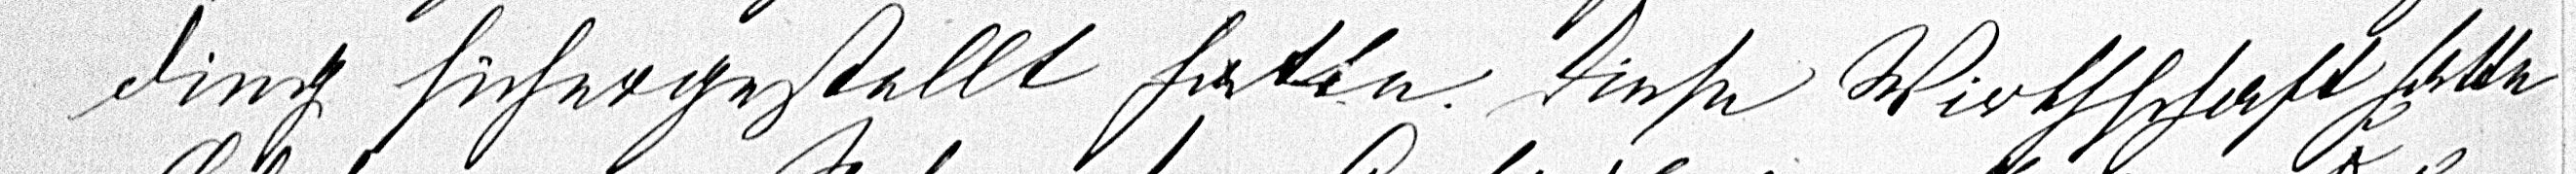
ding sichergestellt hatte. Diese Wirthschaft hatte
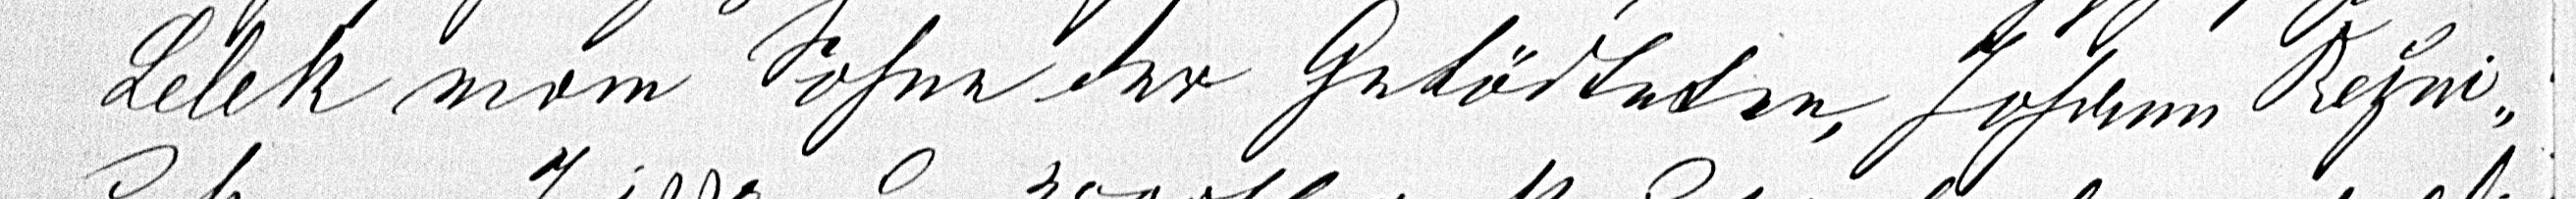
Lelek mom Sohne der Getödteten, Johann Rezni¬
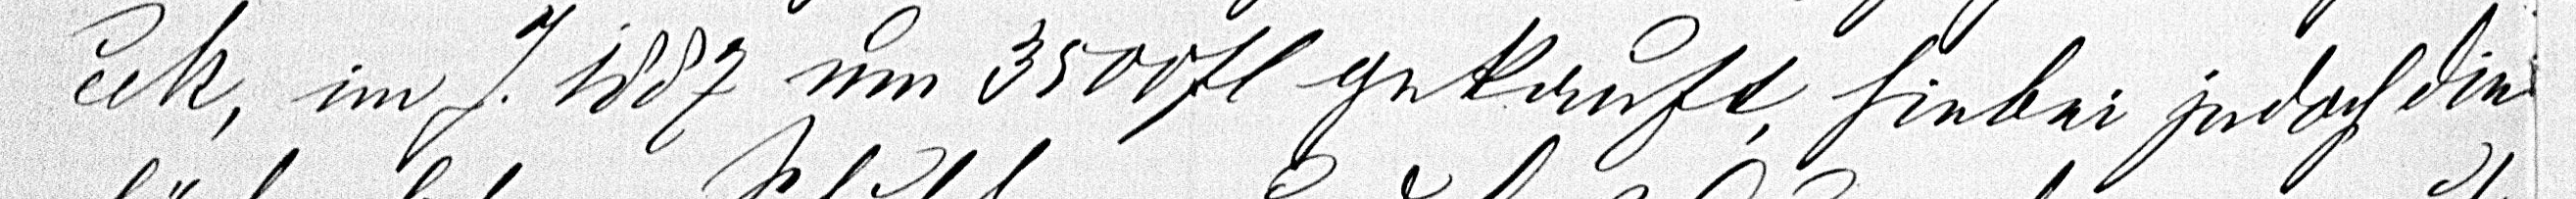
ček, im J. 1887 um 3500 fl gekauft, hiebei jedoch die
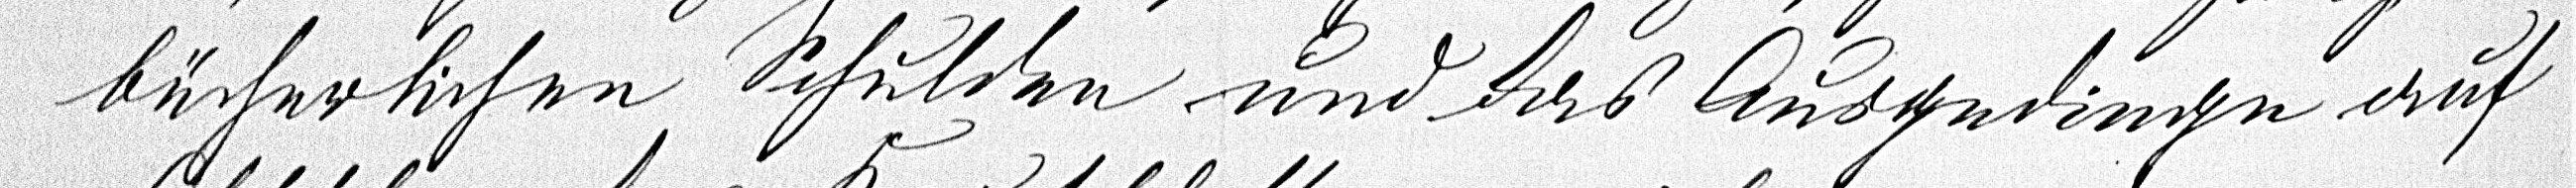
bücherlichen Schulden und das Ausgedinge auf
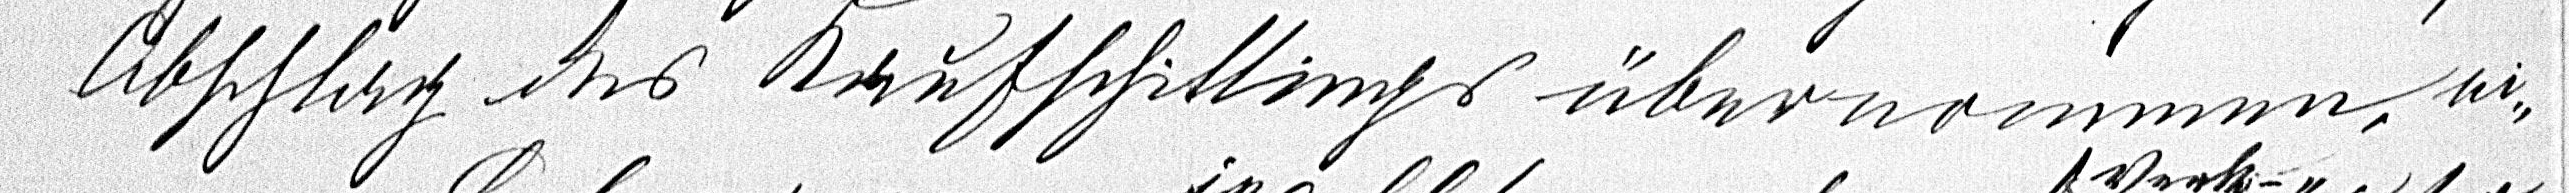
Abschlag des Kaufschillings übernommen, ei¬
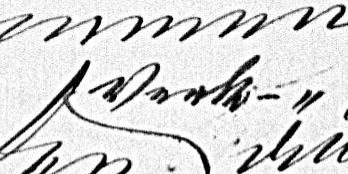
Verk
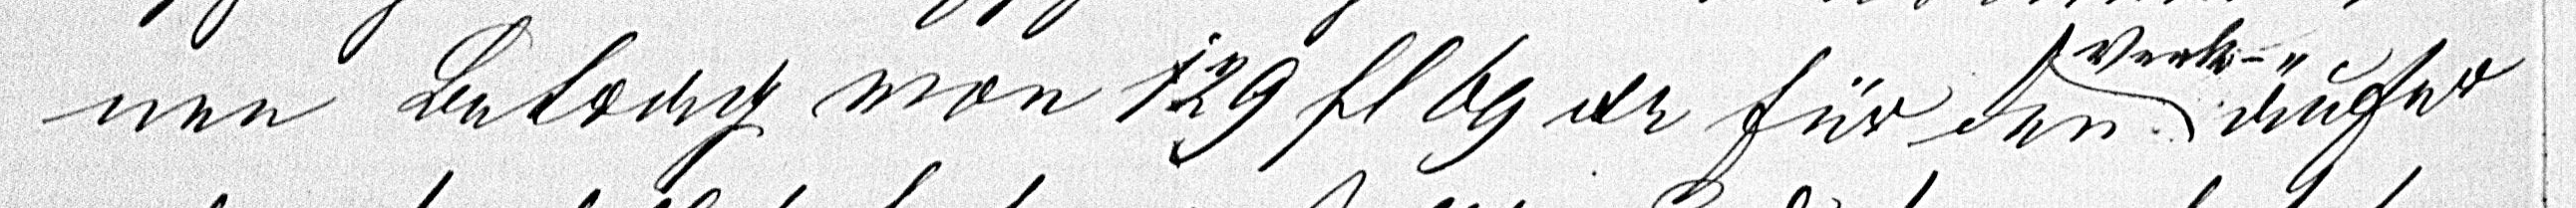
nen Betrag mon 129 fl 69 xx für den äufer
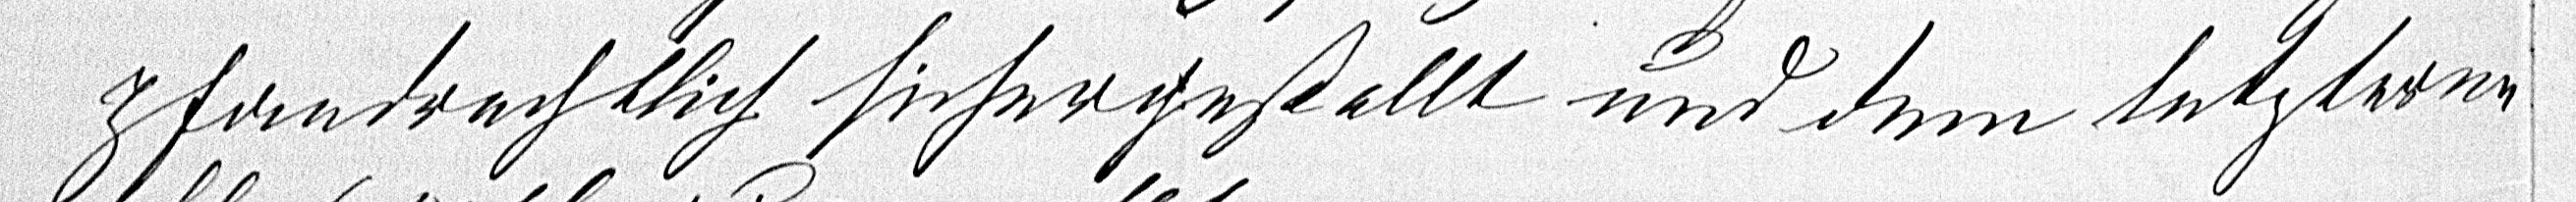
Zfandrechtlich sichergestellt und dem letzterne
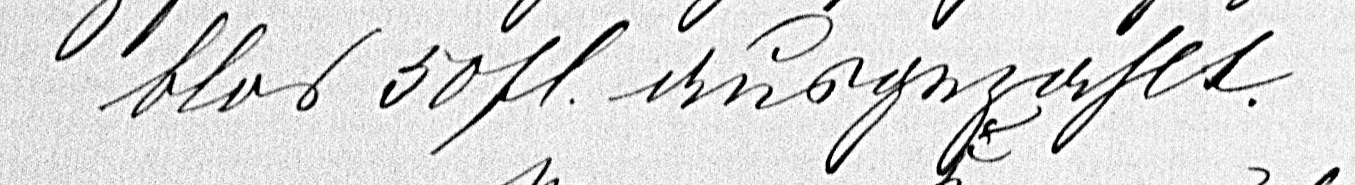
blos 50 fl. ausgezahlt.
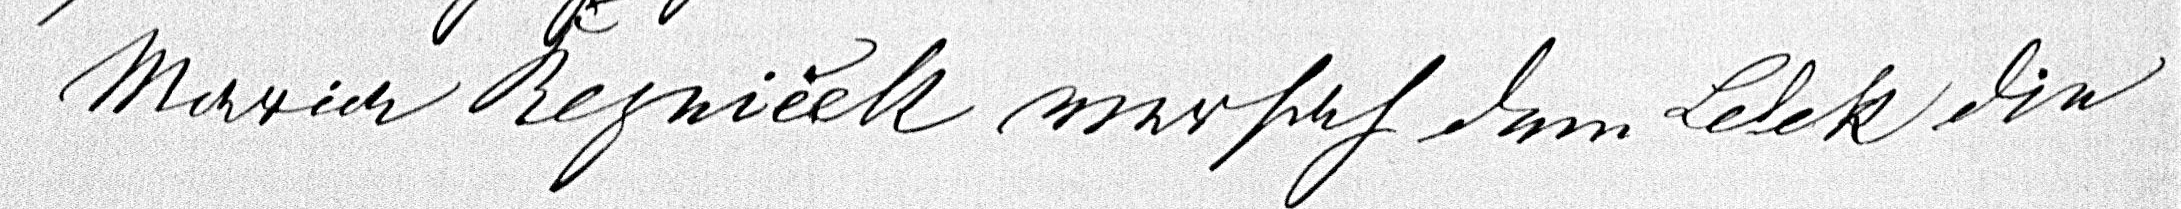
Maria Rezniček versah dem Lelek die
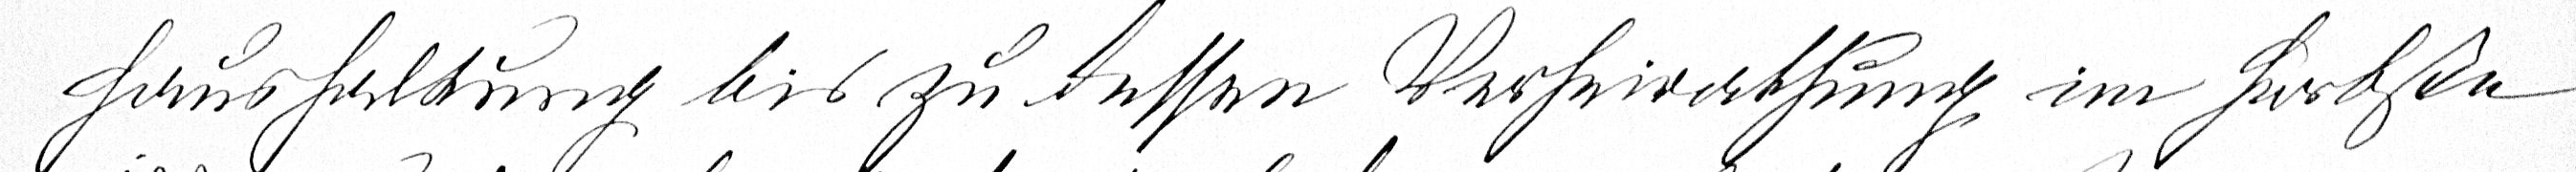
Haushaltung bis zu dessen Verheirathung im Herbste
